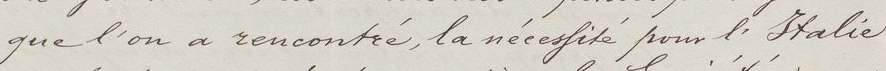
que l'on a rencontré, la nécessité pour l'Italie
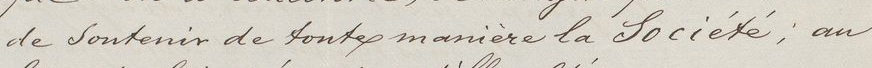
de soutenir de toute manière la Société; au
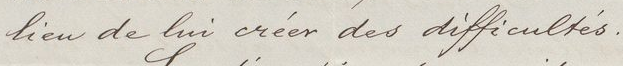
lieu de lui créer des difficultés.
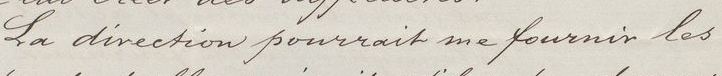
La direction pourrait me fournir les
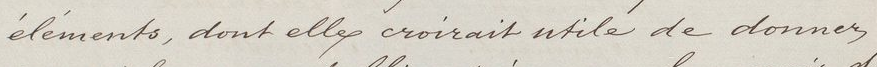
élémenets, dont elles croirait utile de donner
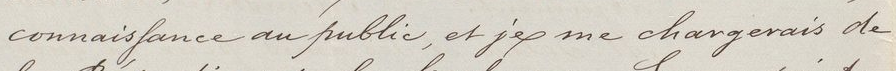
connaissance au public, et je me chargerais de
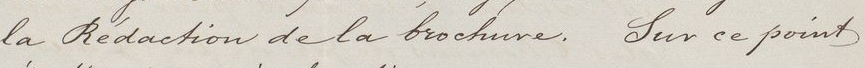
la Rédaction de la brochure. Sur ce point
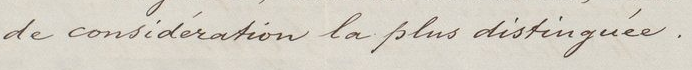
de considération la plus distinguée.
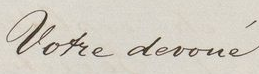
Votre devoué
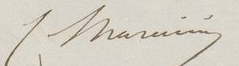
C. Maraini
